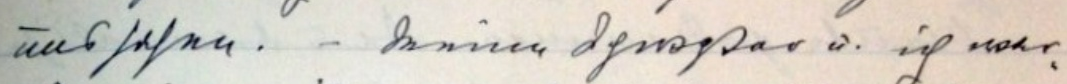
uns sahen. – Meine Schwester u. ich war
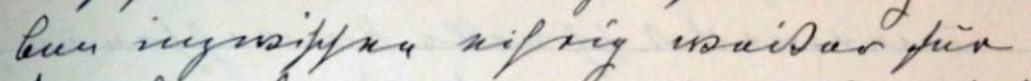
ben inzwischen eifrig weiter für
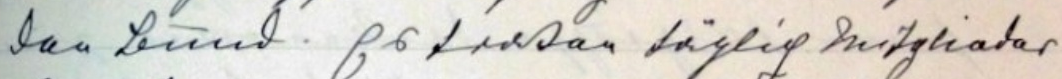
den Bund. Es traten täglich neue Mitglieder
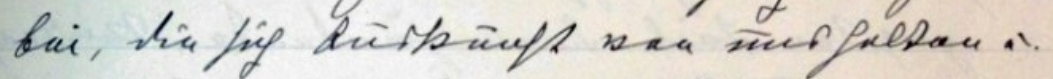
bei, die sich Auskunft von uns holten u.
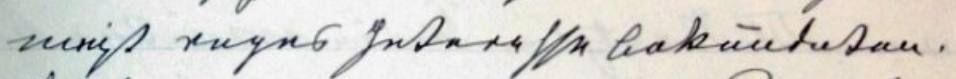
meist reges Interesse bekundeten.
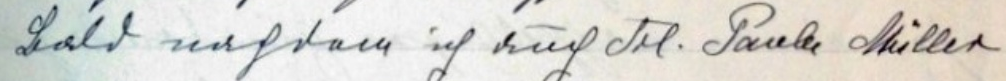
Bald nachdem ich auch Frl. Paula Müller
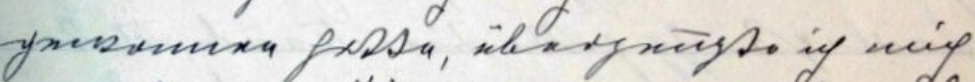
geworben hatte, überzeugte ich mich
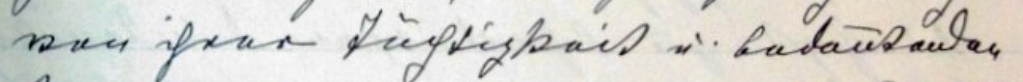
von ihrer Tüchtigkeit u. bedeutenden
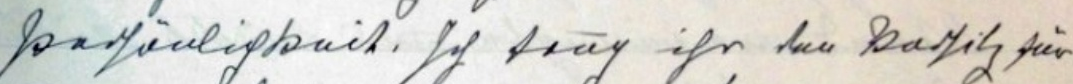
Persönlichkeit. Ich trug ihr den Vorsitz für
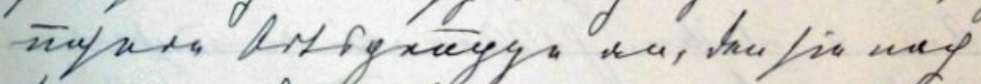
unsere Ortsgruppe an, den sie nach
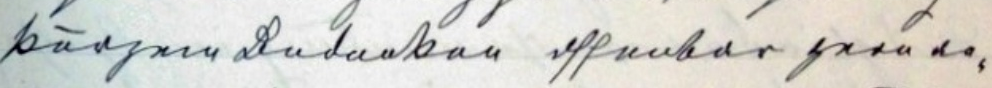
kurzem Bedenken offenbar gern an
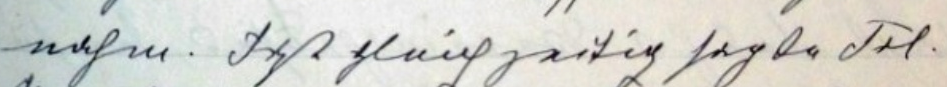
nahm. Fast gleichzeitig sagte Frl.
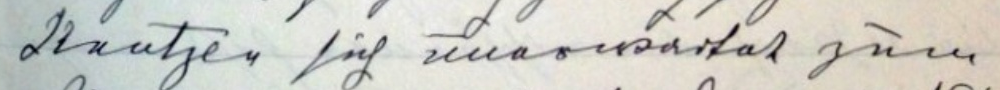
Knutzen sich unerwartet zum
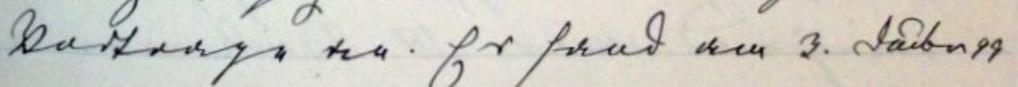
Vortrage an. Er fand am 3. Debr. 99
